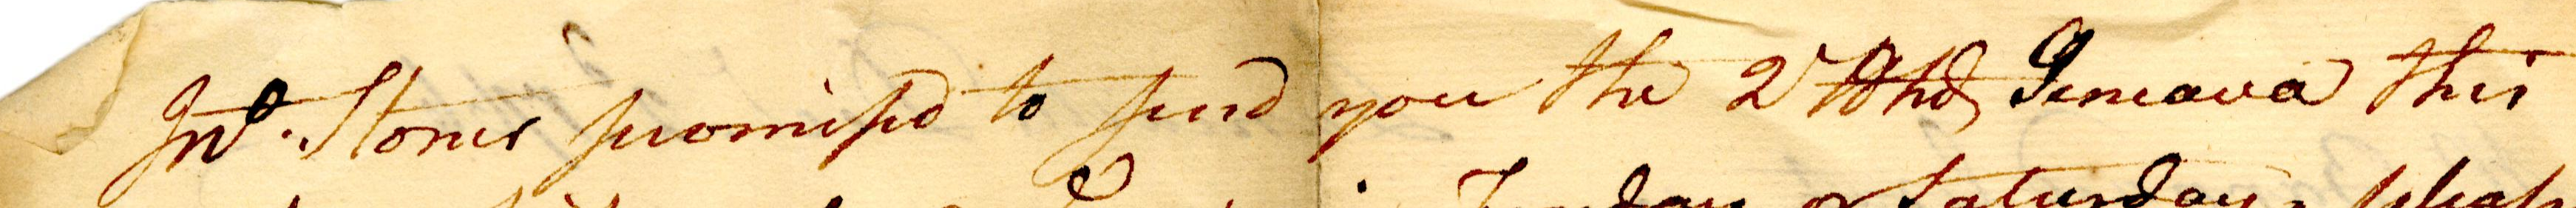In^o Stones promised to send you the 2 Hhd Geneava this
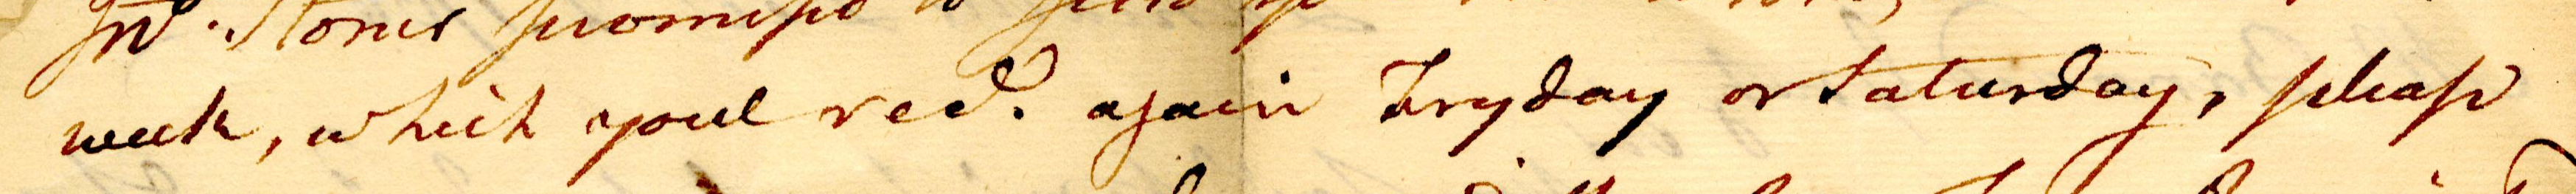week, which youl rec^e. again Fryday or Saturday, please
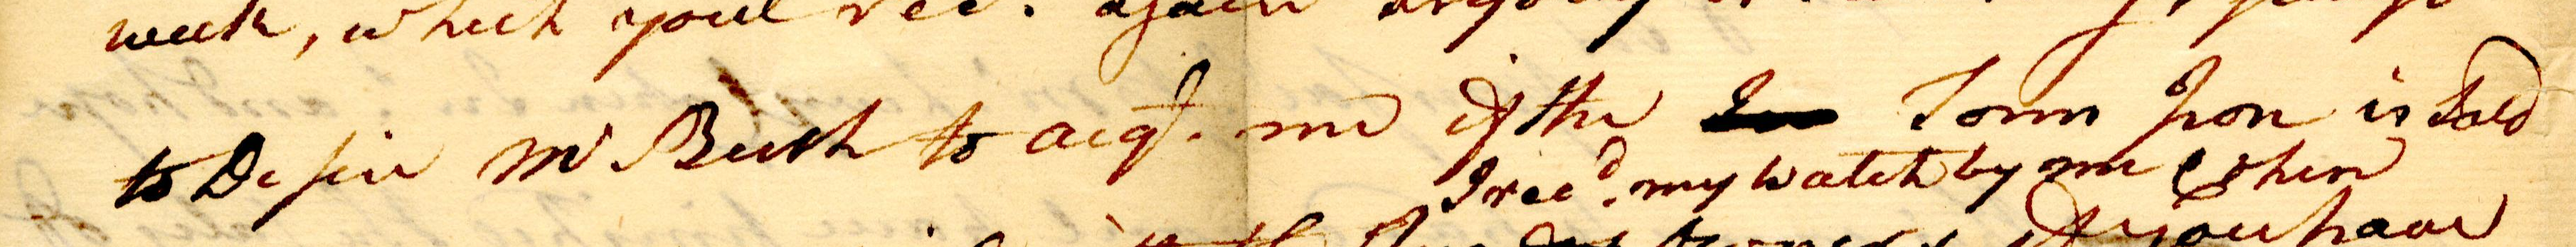to Desire M^r Bush to acq^t. me if the [__] Town Iron is sold
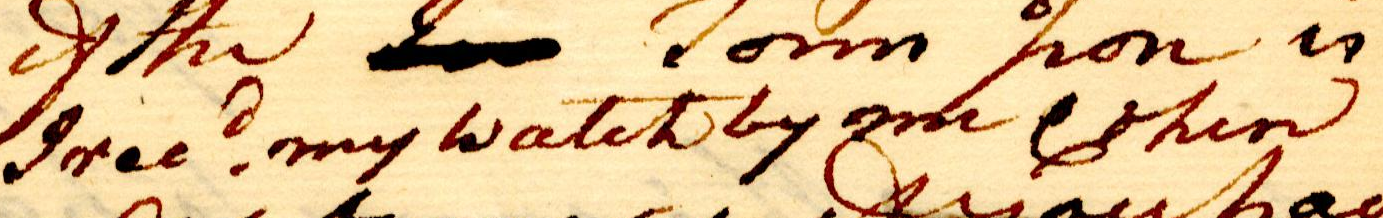I rec^d my watch by M^r Cohen
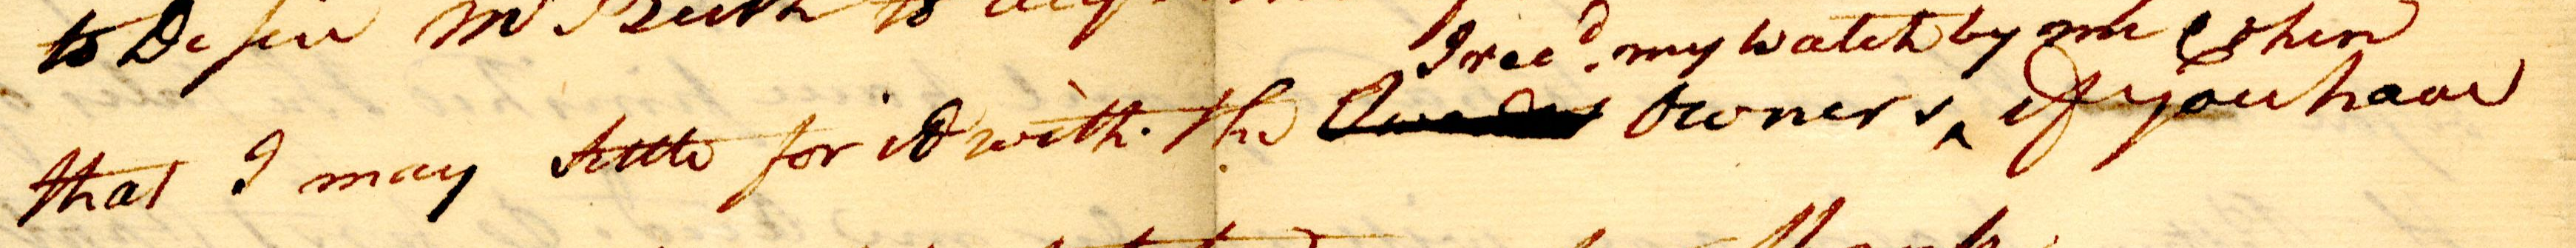that I may settle for it with the [______] owners ^ if you have
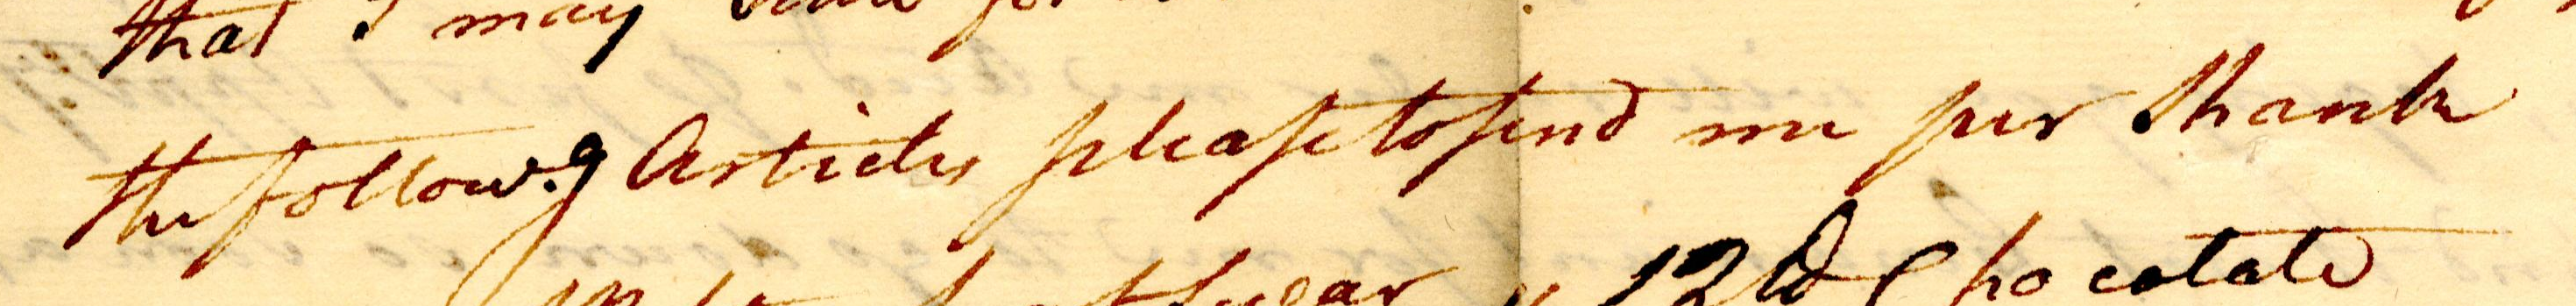the follow.g Articles please to send me per Shank
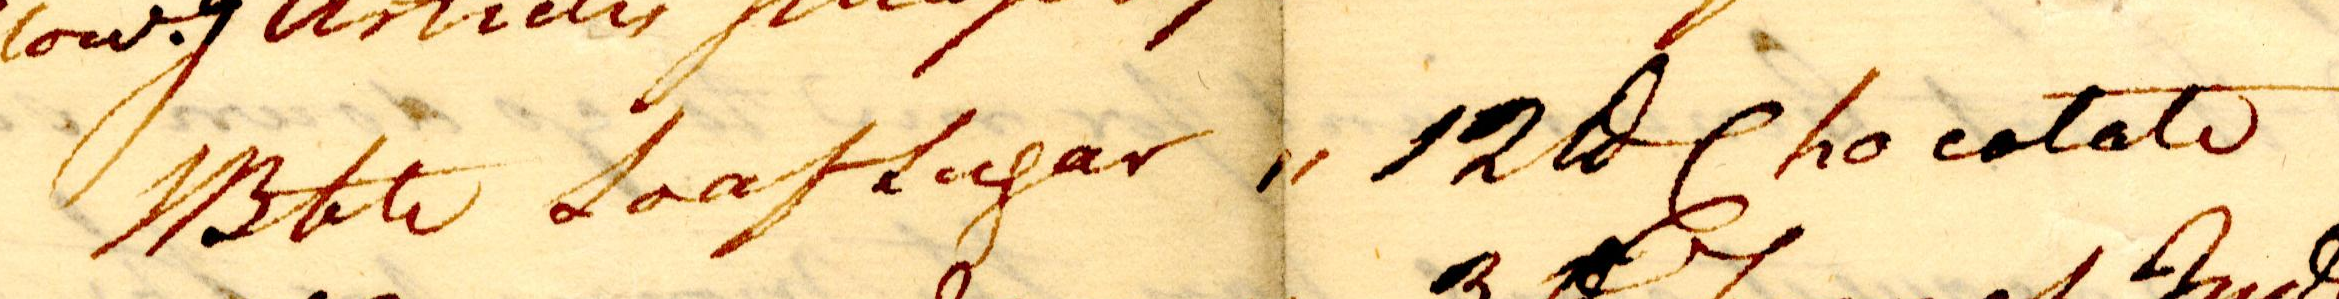Bble Loaf Sugar .. 12 ld Chocalate
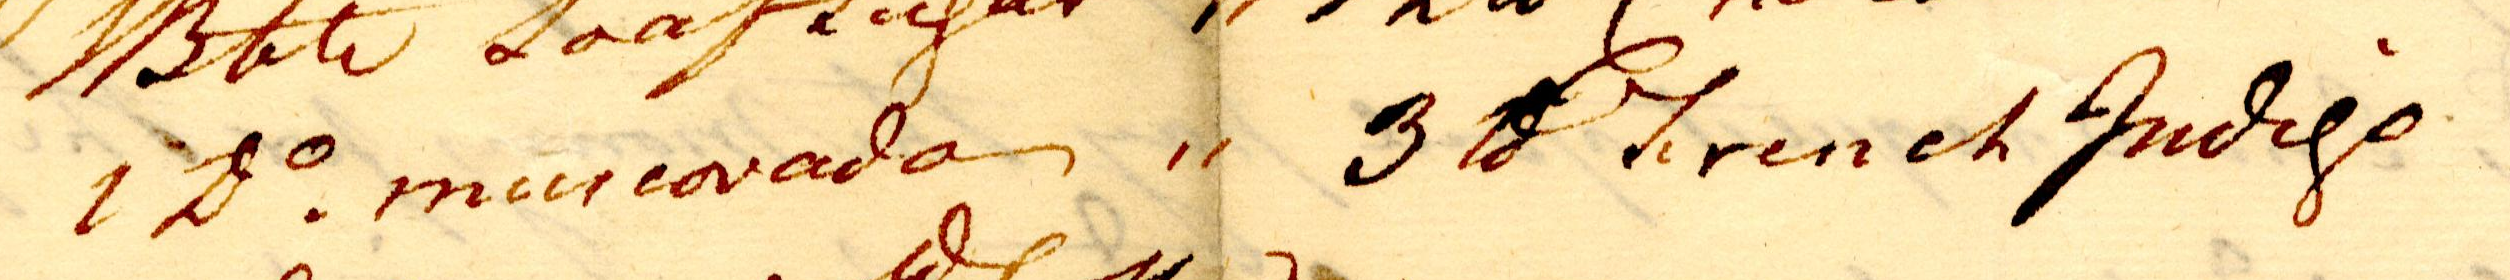1 D^o. muscovada .. 3 ld French Indigo
